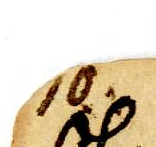10
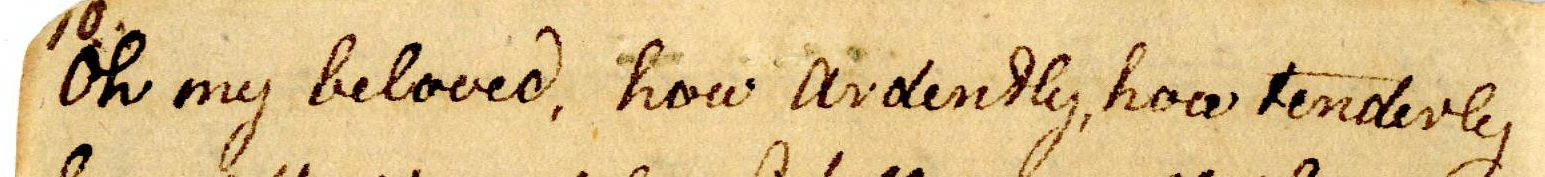Oh my beloved, how ardently, how tenderly
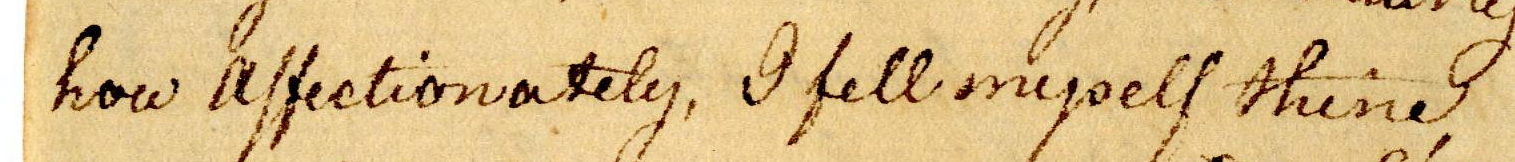how Affectionately, I fell myself thine,
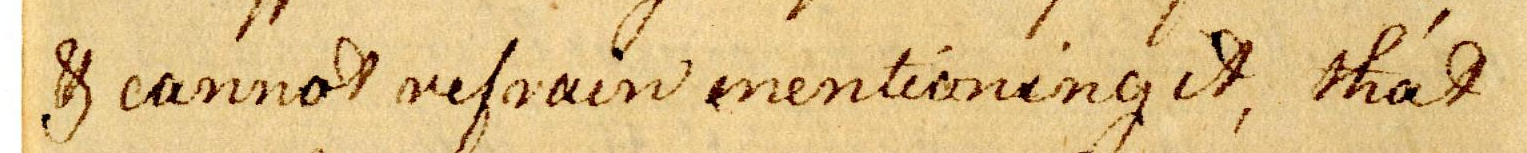& cannot refrain mentioning it that
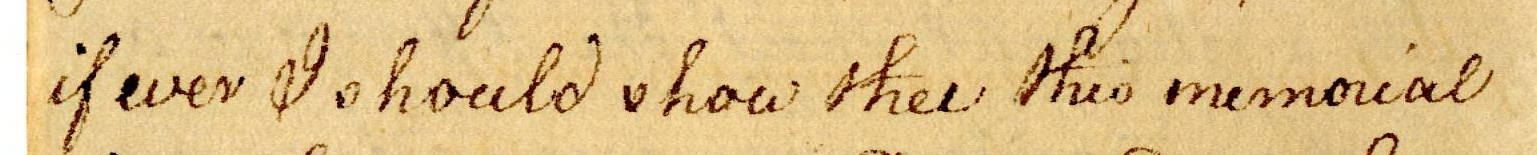if ever I should show thee this memorial
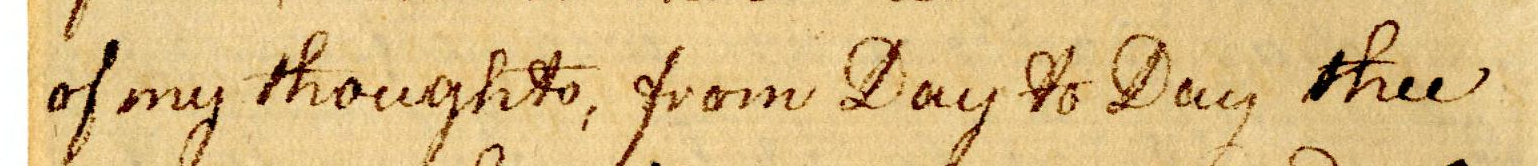of my thoughts, from Day to Day thee
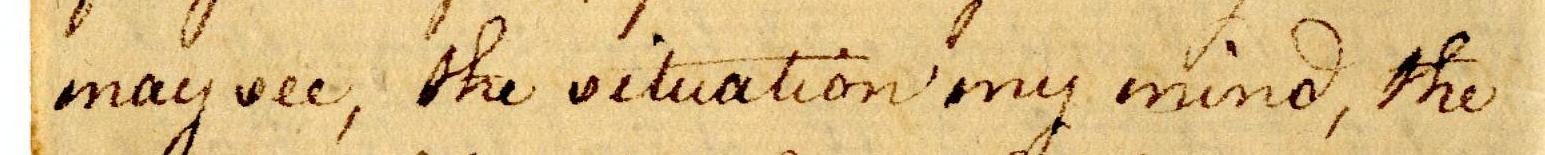may see, the situation my mind, the
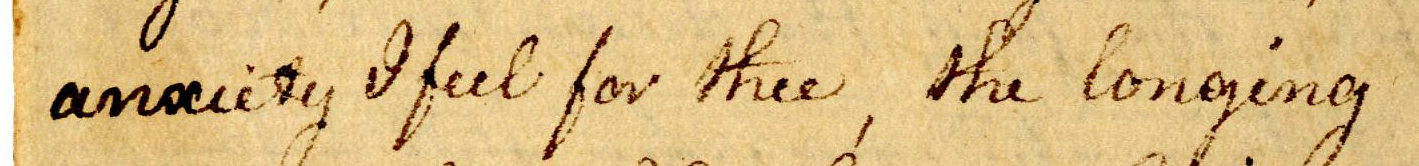anxiety I feel for thee, the longing
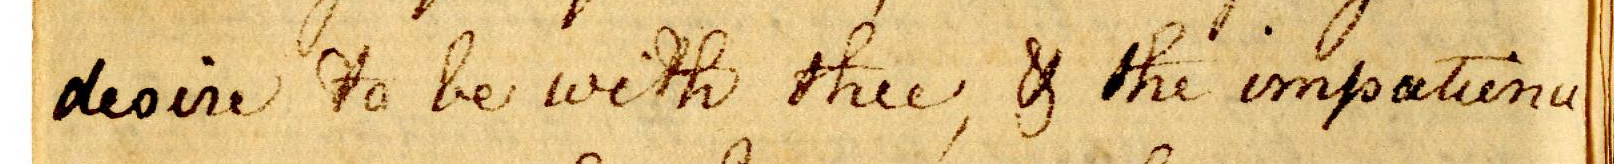desire to be with thee, & the impatience
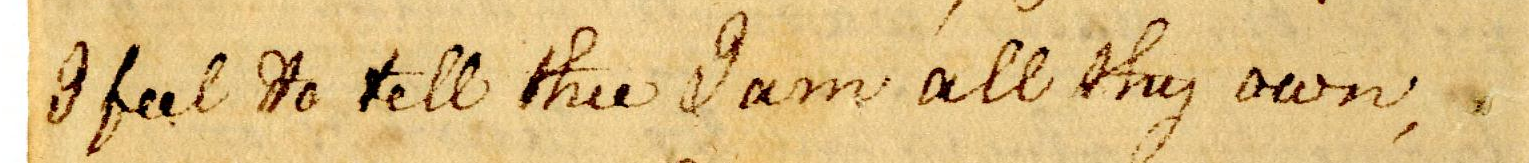I feel to tell thee I am all thy own,
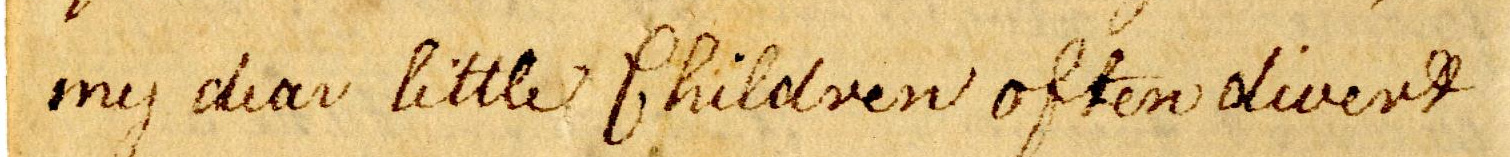my dear little Children often divert
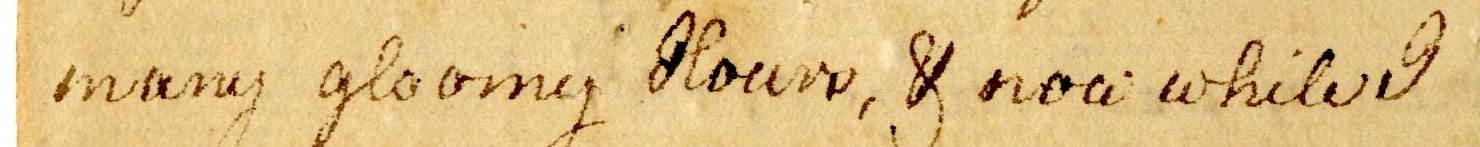many gloomy Hours, & now while I
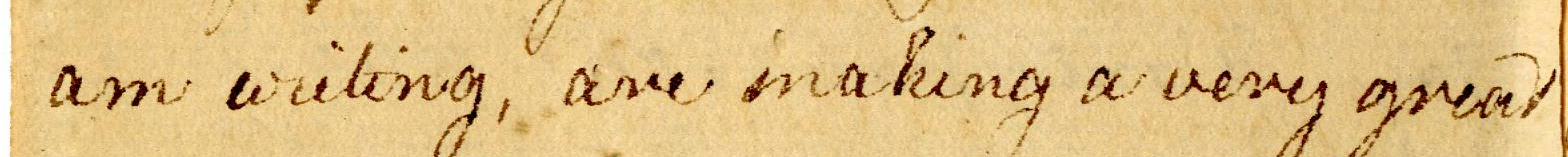am writing, are making a very great
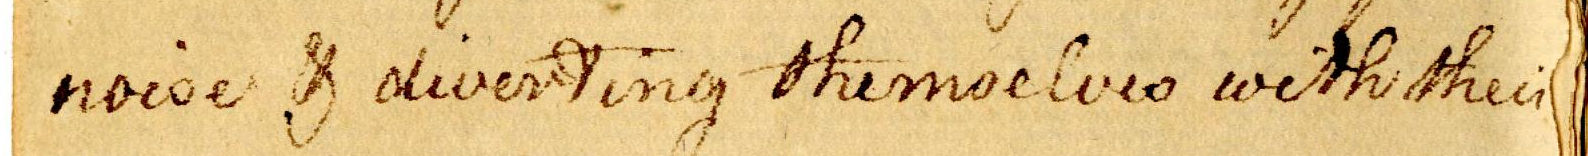noise & diverting themselves with their
